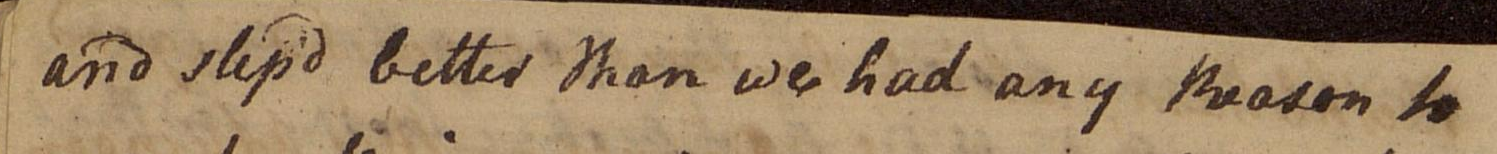and slep'd better than we had any Reason to
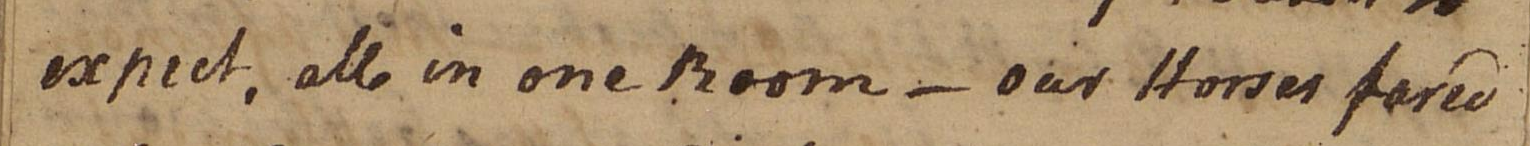expect, all in one Room- our Horses fared
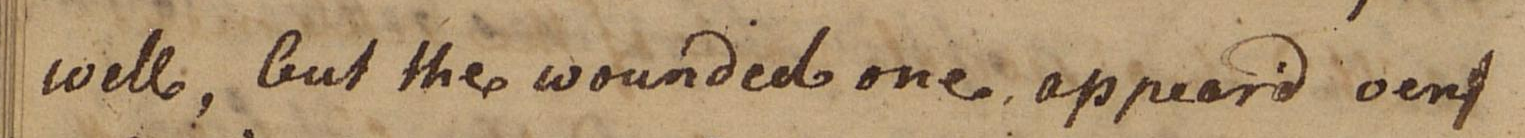well, but the wounded one, appear'd very
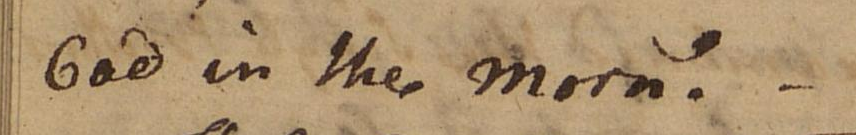bad in the morn^g.-
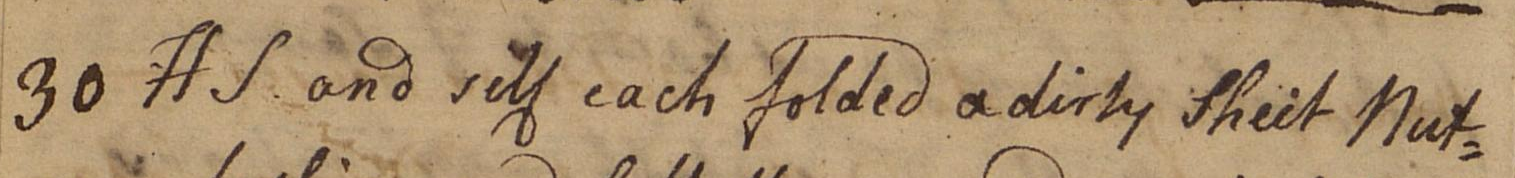30 H S. and self each folded a dirty Sheet Nut-
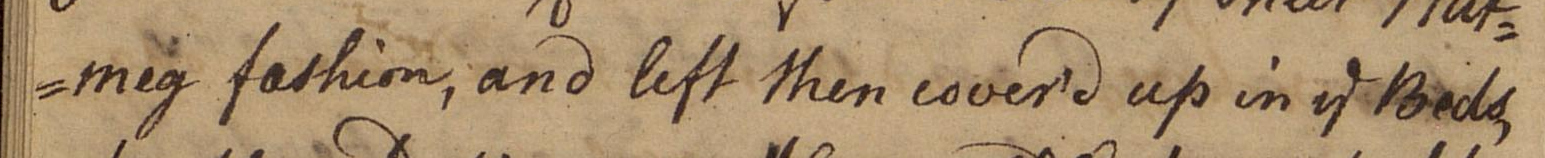-meg fashion, and left then cover'd up in y^e Beds,
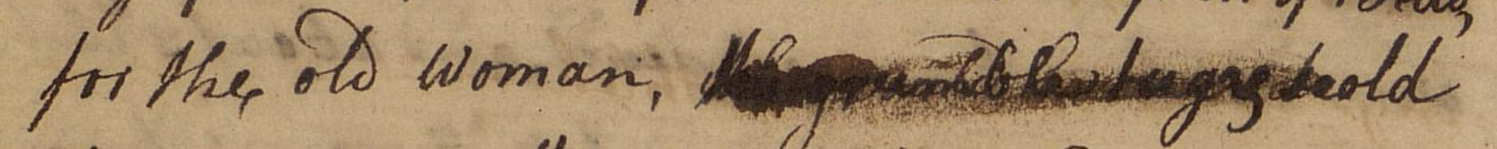for the old woman, [________________]old
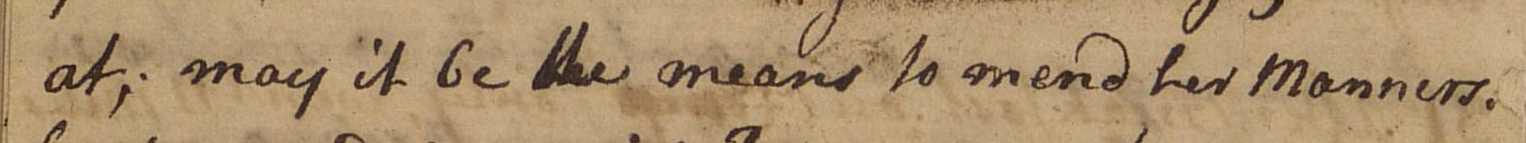at; may it be the means to mend her Manners.
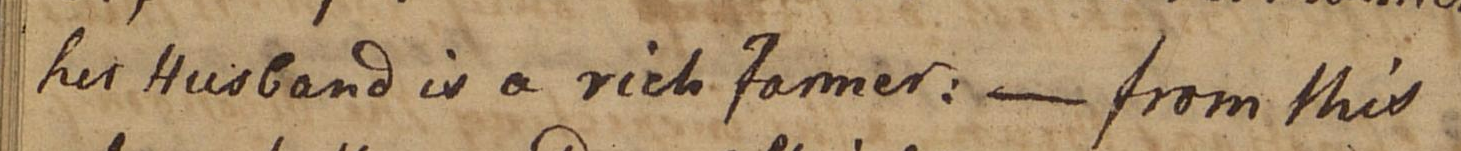her Husband is a rich famer:- from this
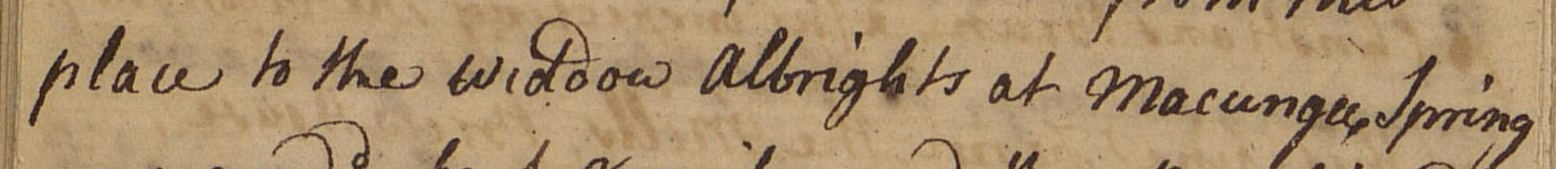place to the Widdow Albrights at Macungu? Spring
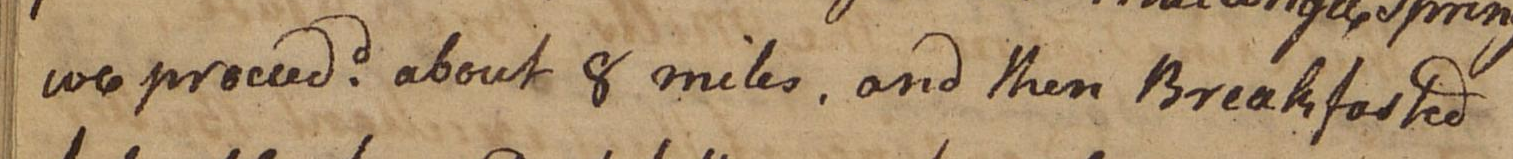we proceed^d. about 8 miles, and then Breakfasted
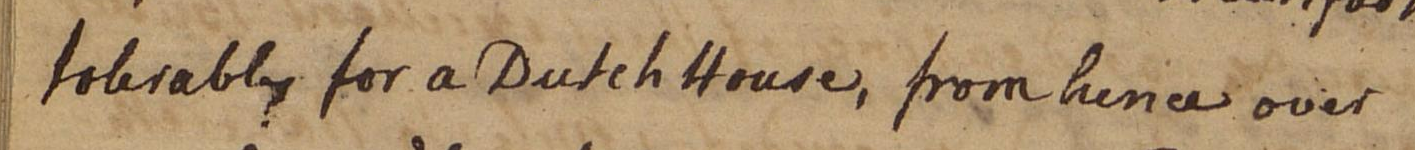tolerably for a Dutch House, from hence over
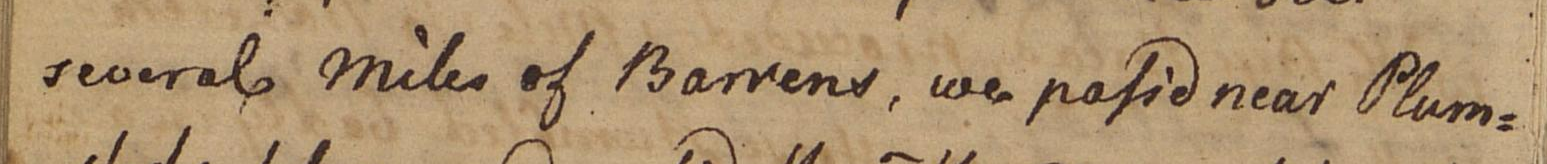several Miles of Barrens, we passd near Plum-
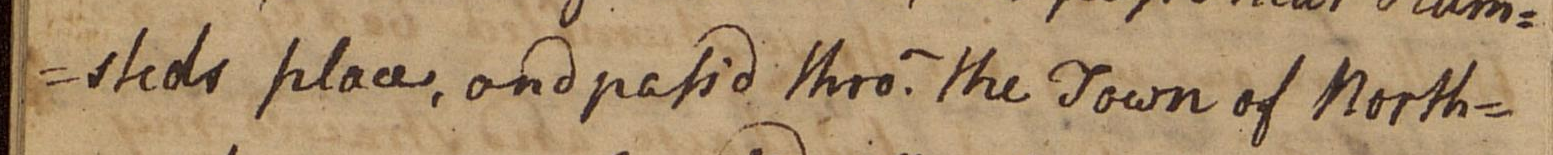-steds place, and pass'd thro' the Town of North-
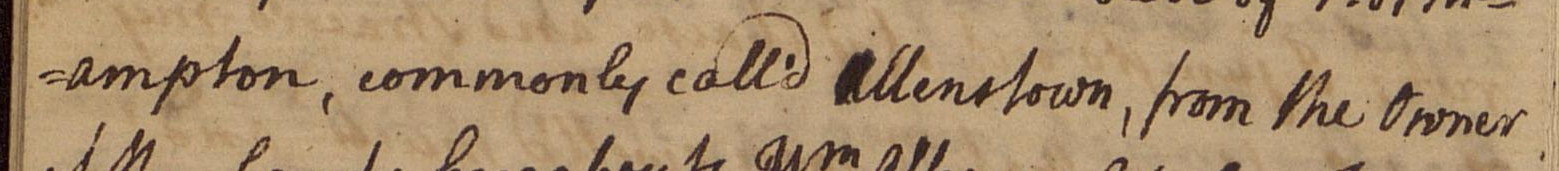-ampton, commonly call'd Allenstown, from the Owner
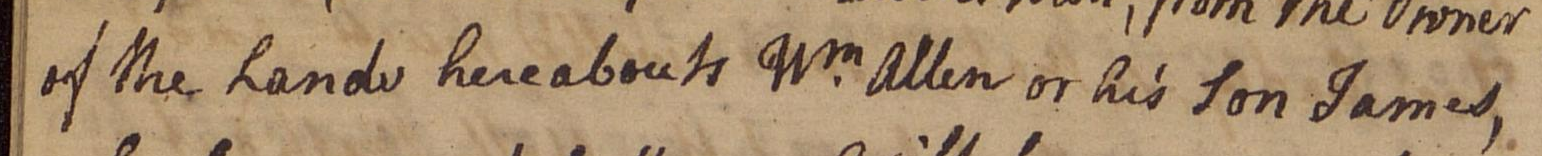of the hands hereabouts W^m. Allen or his Son James,
